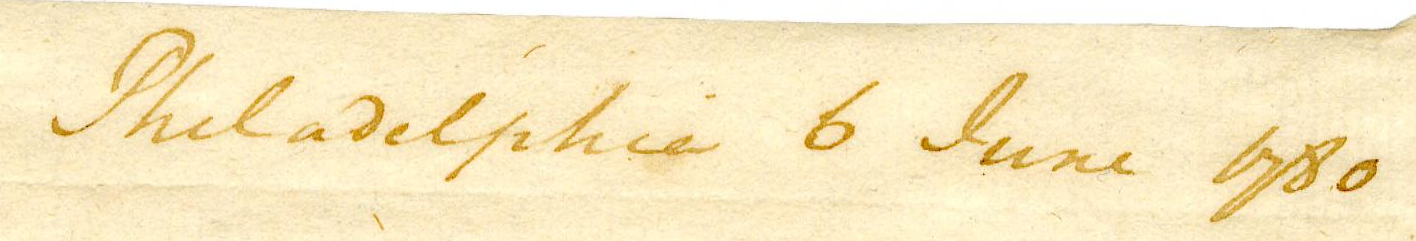Philadelphia 6 June 1780
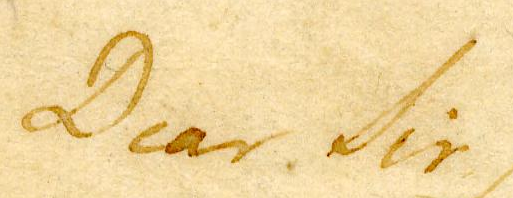Dear Sir
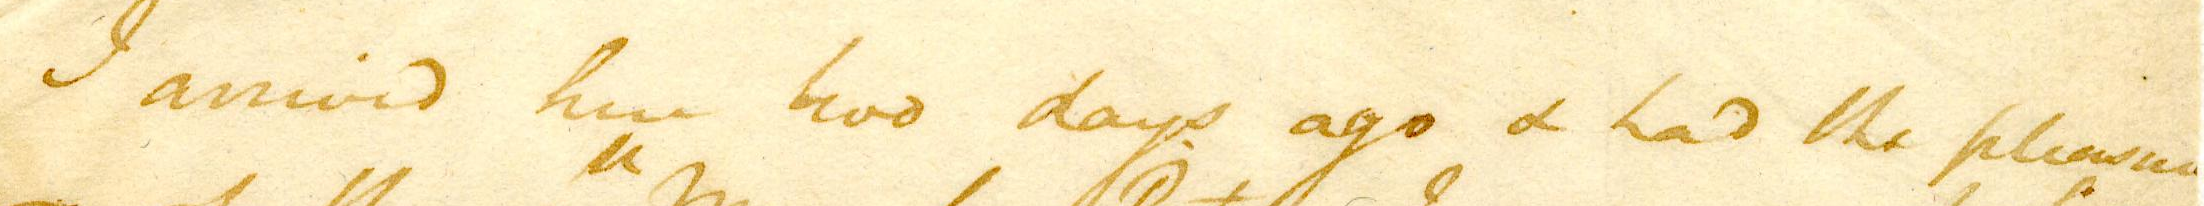I arrived here two days ago & had the pleasure
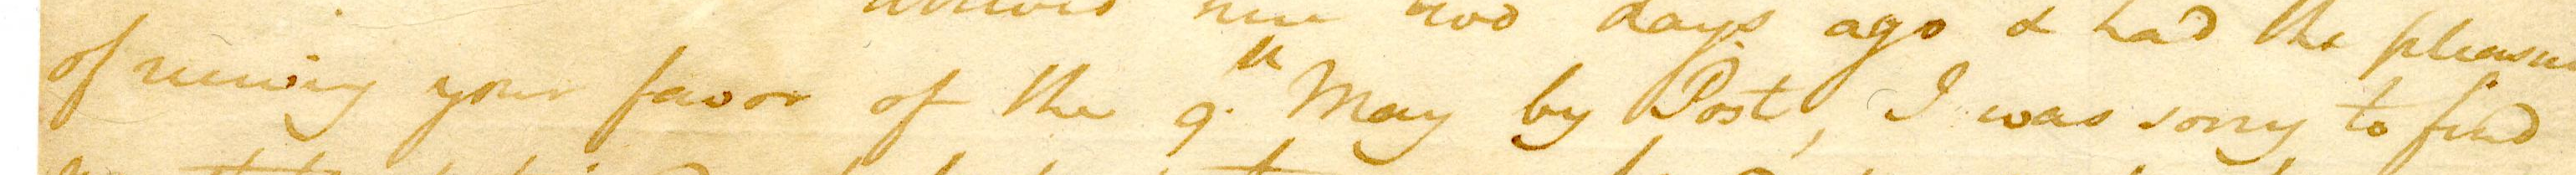of receiving your favor of the 9^th. May by Post, I was sorry to find
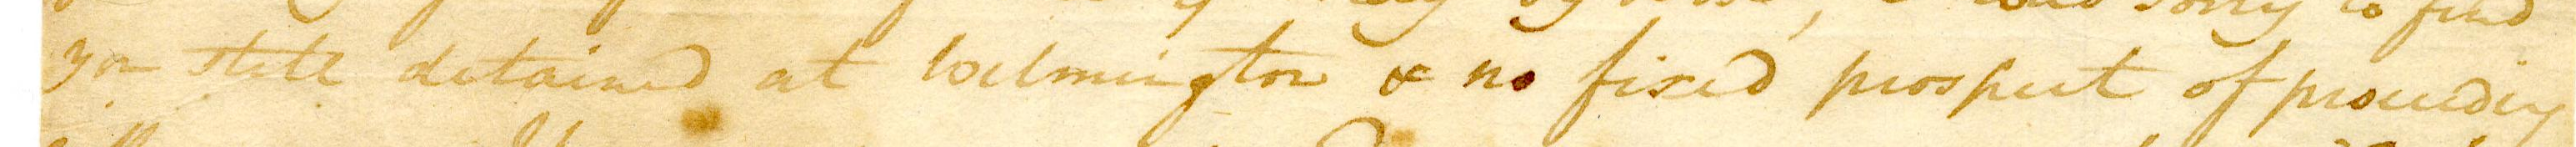you still detained at Wilmington & no fixed prospect of proceeding
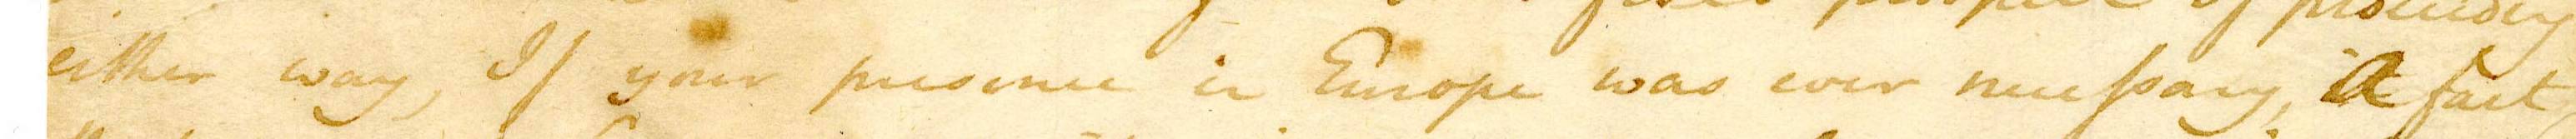either way, If your presence in Europe was ever necessary, A fact
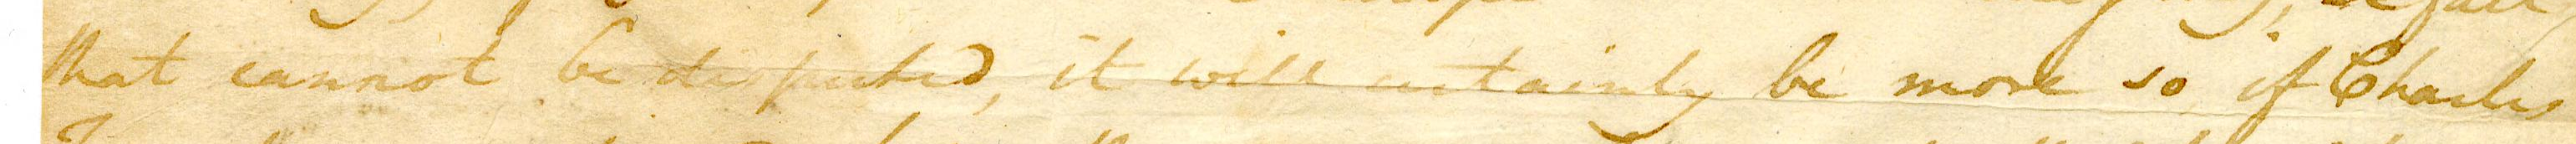that cannot be disputed, it will certainly be more so if Charles
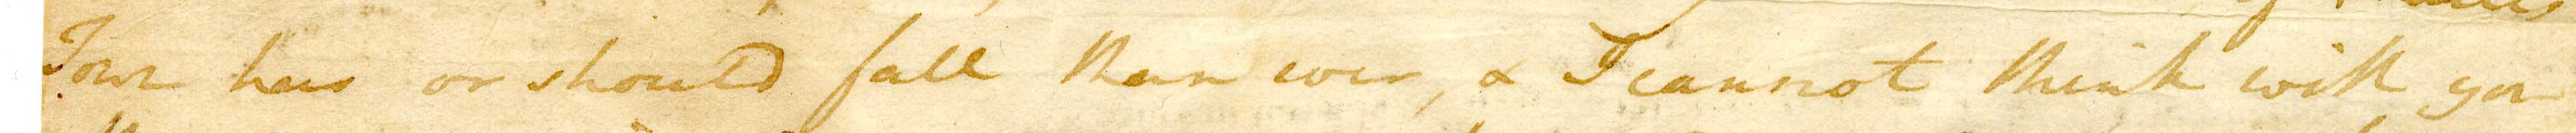Town has or should fall than ever & I cannot think with you
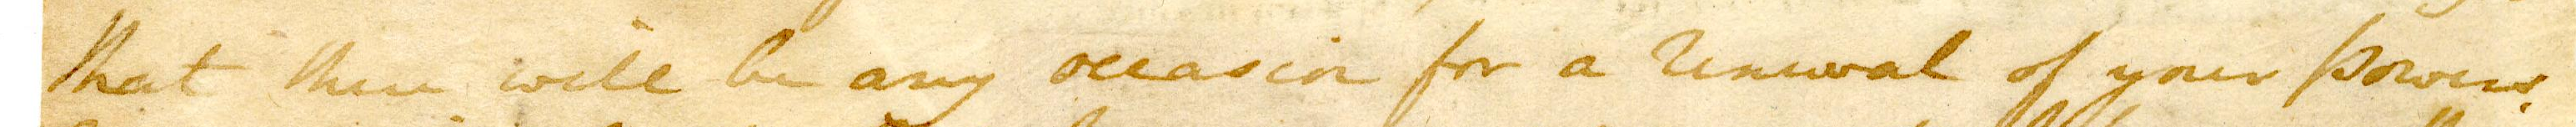that there will be any occasion for a renewal of your powers
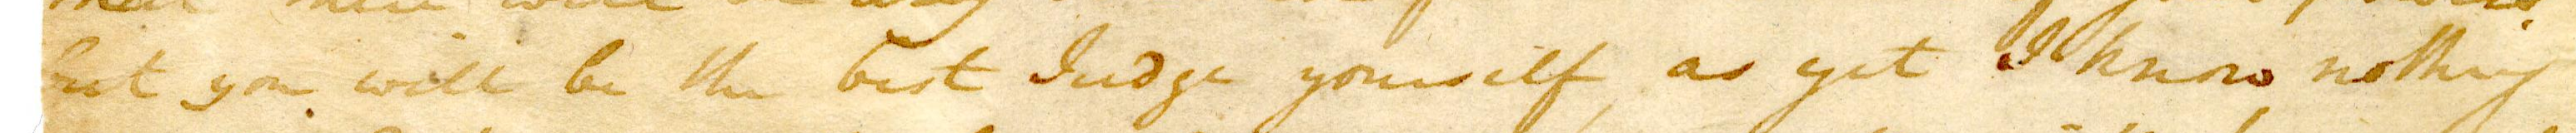but you will be the best Judge yourself as yet I know nothing
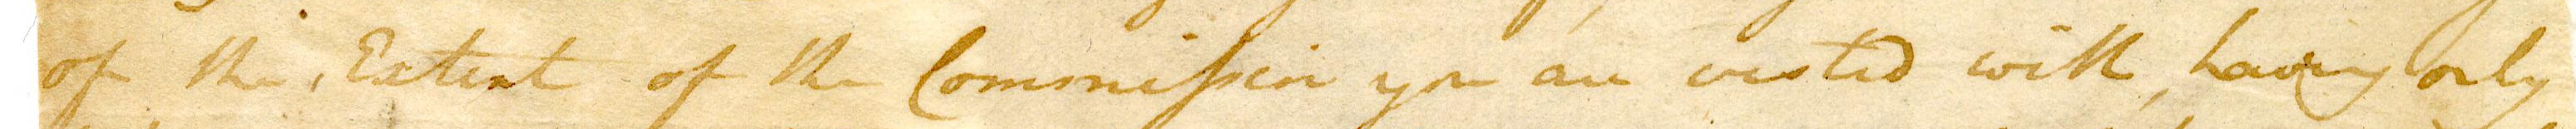of the Extent of the Commission you are vested with having only
